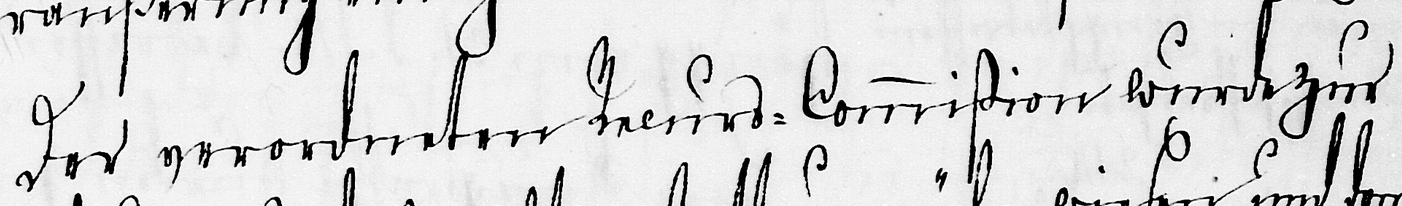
Der verordneten Recurs-Commißion wurde zur
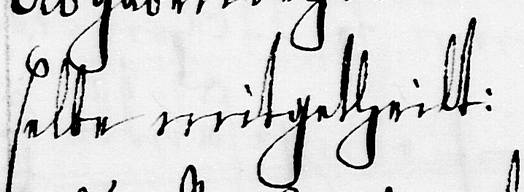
selbe mitgetheilt:
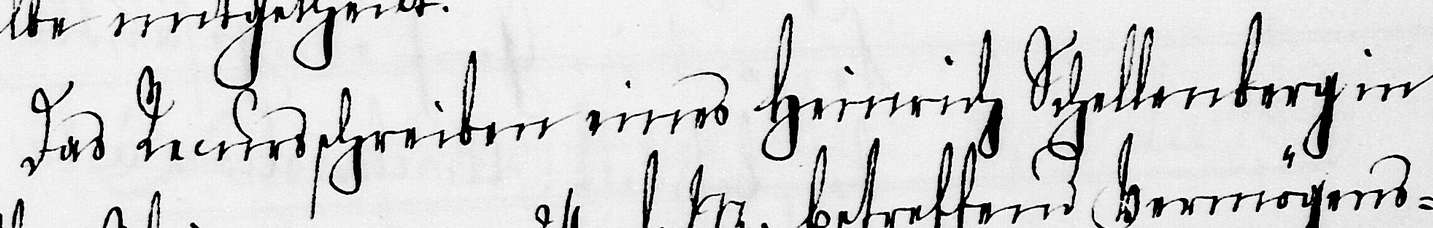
Das Recursschreiben eines Heinrich Schellenberg in
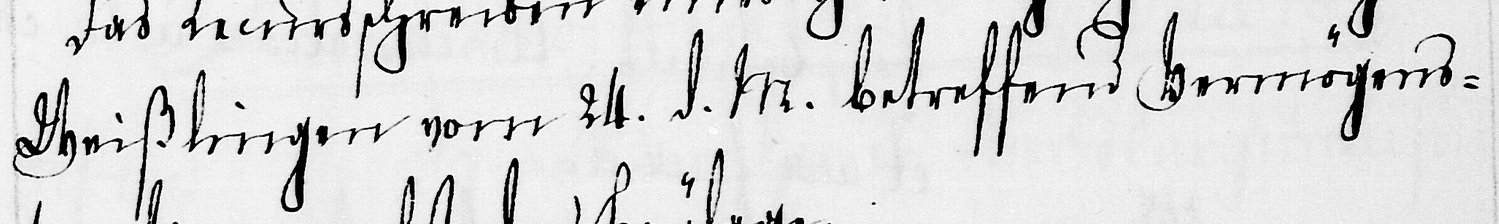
Weißlingen vom 24. d. M. betreffend Vermögens¬
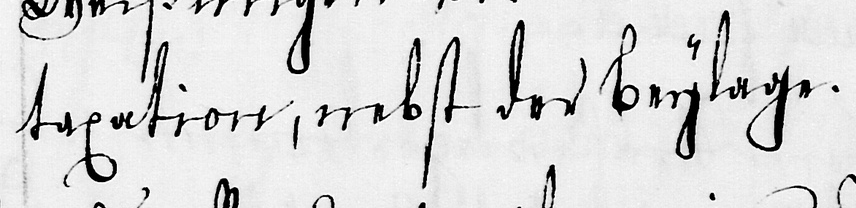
taxation, nebst der Beylage.
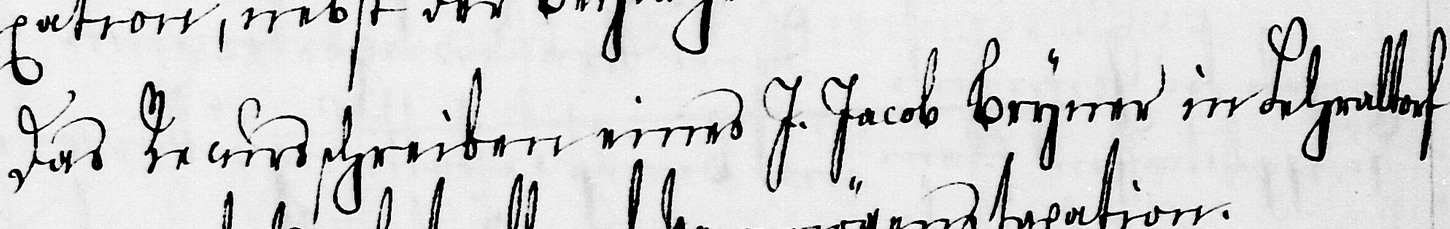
Das Recursschreiben eines J. Jacob Bryner in Fehraltorf
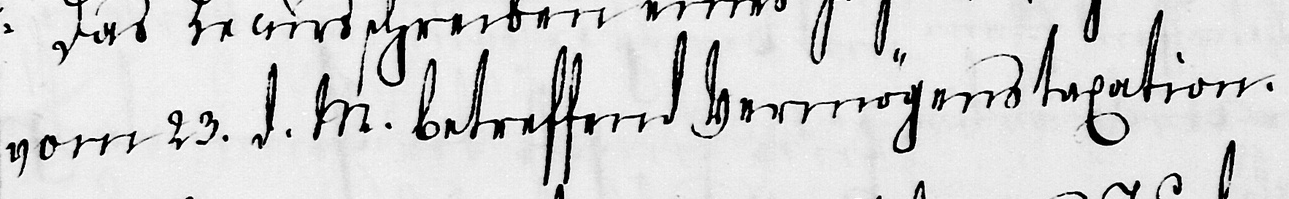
vom 23. d. M. betreffend Vermögenstaxation.
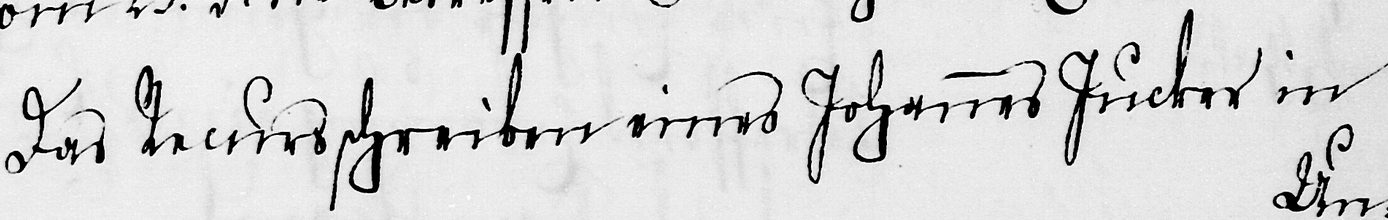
Das Recursschreiben eines Johannes Jucker in
